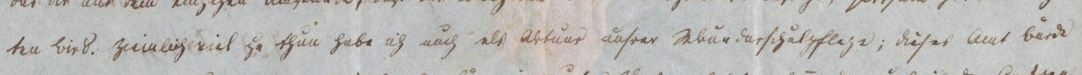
ten wird. Ziemlich viel zu thun habe ich auch als Aktuar unsrer Sekundarschulpflege; dieses Amt würde
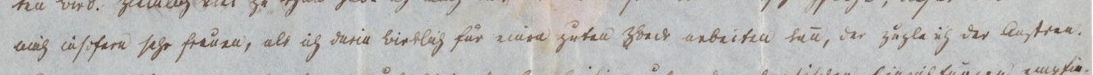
mich insofern sehr freuen, als ich darin wirklich für eine guten Zweck arbeiten kann, der zugleich der Anstren-
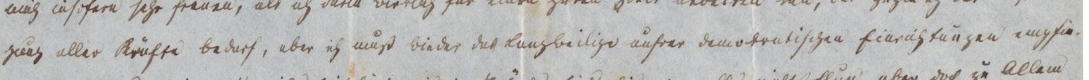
gung aller Kräfte bedarf, aber ich muß wieder das Langweilige unsrer demokratischen Einrichtungen empfin-
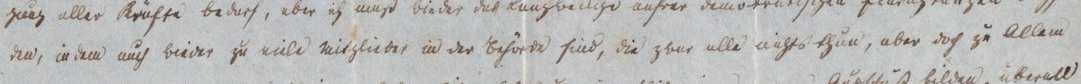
den, indem auch wieder zu viele Mitglieder in der Behörde sind, die zwar alle nichts thun, aber doch zu Allem
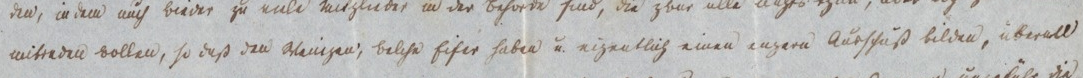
mitreden wollen, so daß den Wenigen, welche Eifer haben u. eigentlich einen engern Ausschuß bilden, überall
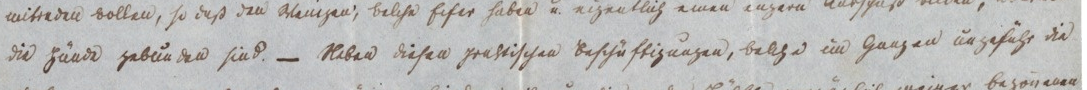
die Hände gebunden sind. – Neben diesen praktischen Beschäftigungen, welche im Ganzen ungefähr die
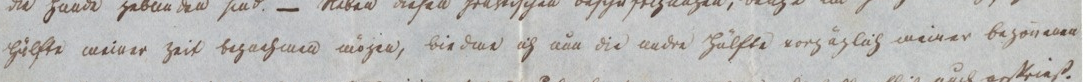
Hälfte meiner Zeit beanspruchen mögen, wiedme ich nun die andre Hälfte vorzüglich meiner begonnenen
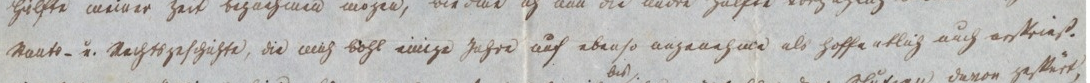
Staats- und Rechtsgeschichte, die mich wohl einige Jahre auf ebenso angenehme als hoffentlich auch ersprieß-
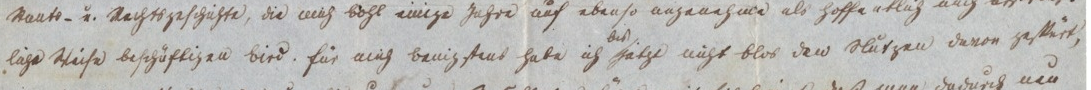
liche Weise beschäftigen wird. Für mich wenigstens habe ich bis jetzt nicht blos den Nutzen davon gespürt,
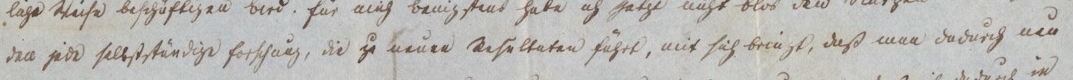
den jede selbstständige Forschung, die zu neuen Resultaten führt, mit sich bringt, daß man dadurch neu
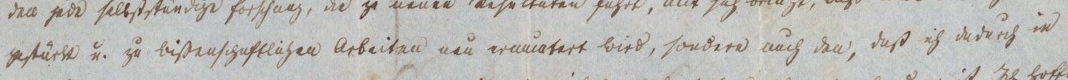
gestärkt u. zu wissenschaftlichen Arbeiten neu ermuntert wird, sondern auch den, daß ich dadurch in
